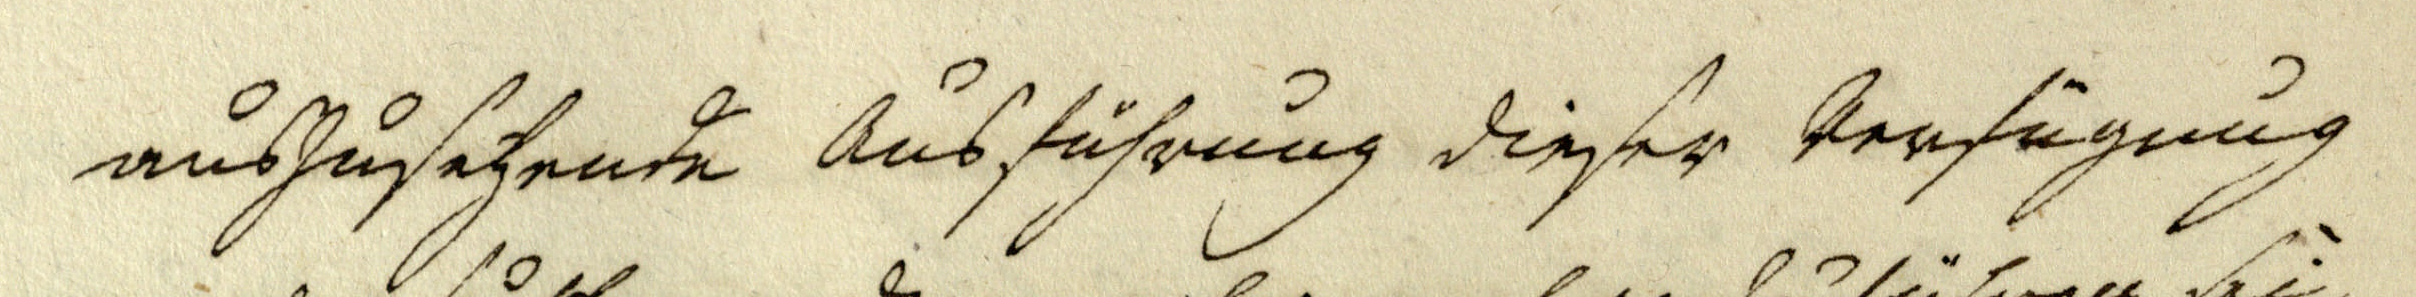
auszusetzende Ausführung dieser Verfügung
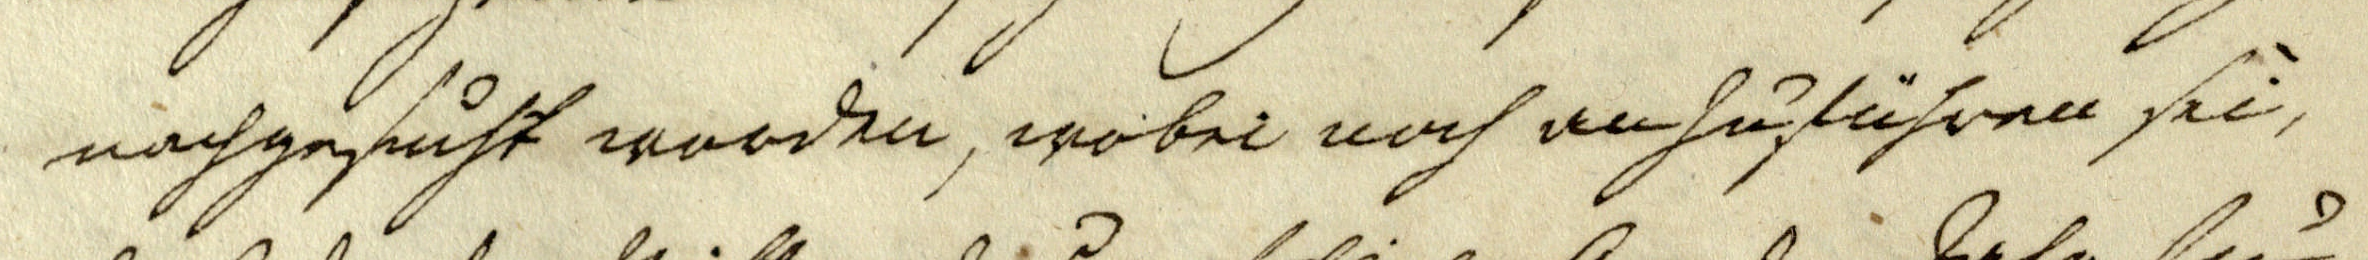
nachgesucht worden, wobei noch anzuführen sei,
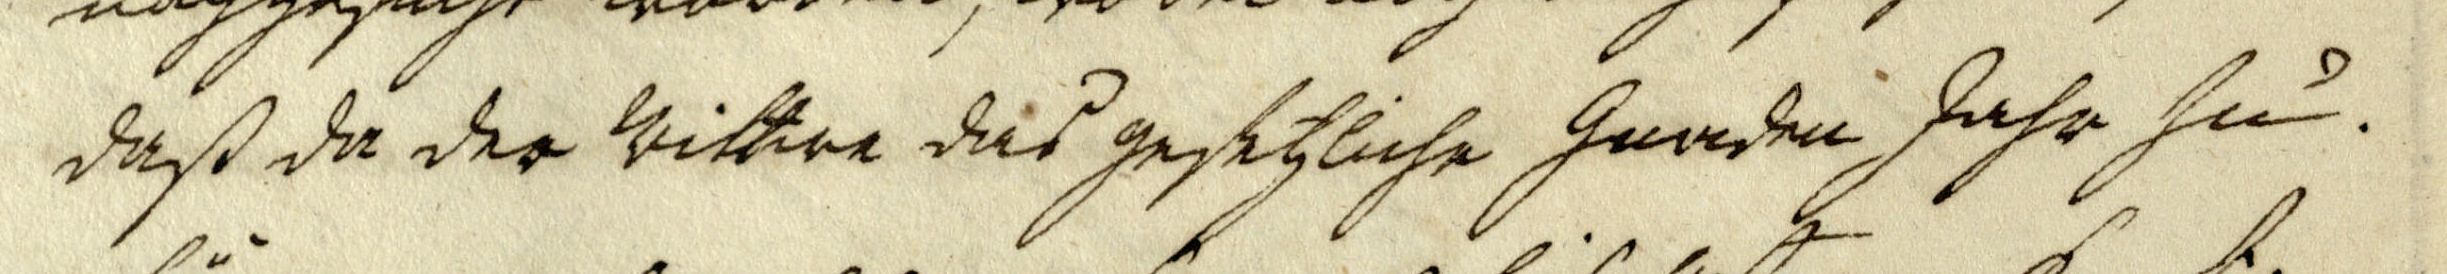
daß da der Wittwe das gesetzliche Gnaden Jahr zu¬
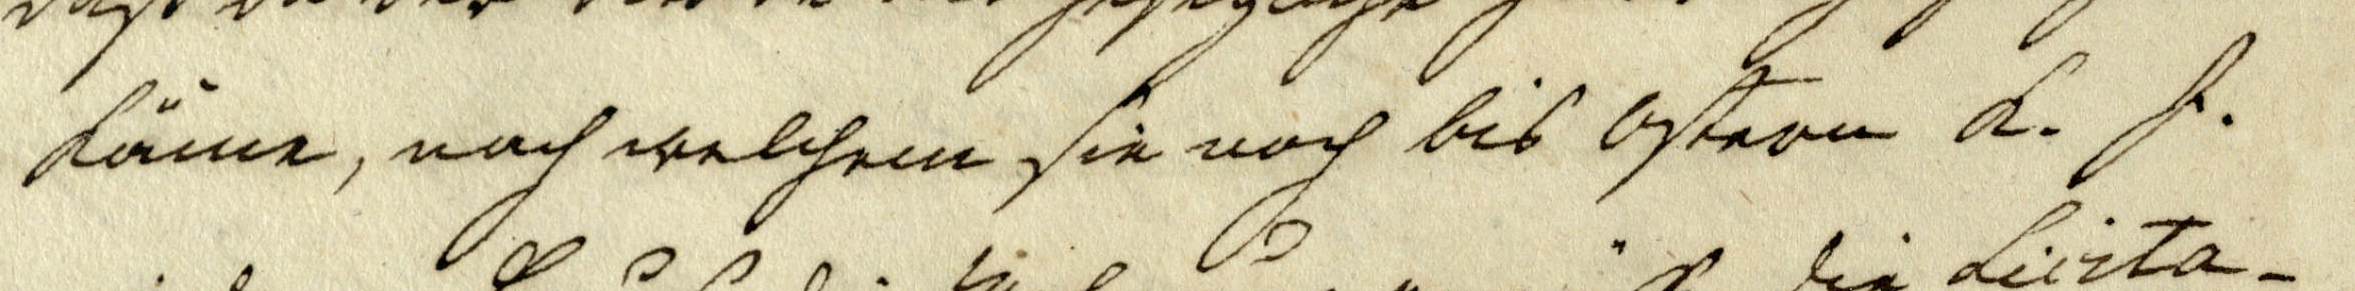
käme, nach welchem sie noch bis Ostern k. J.
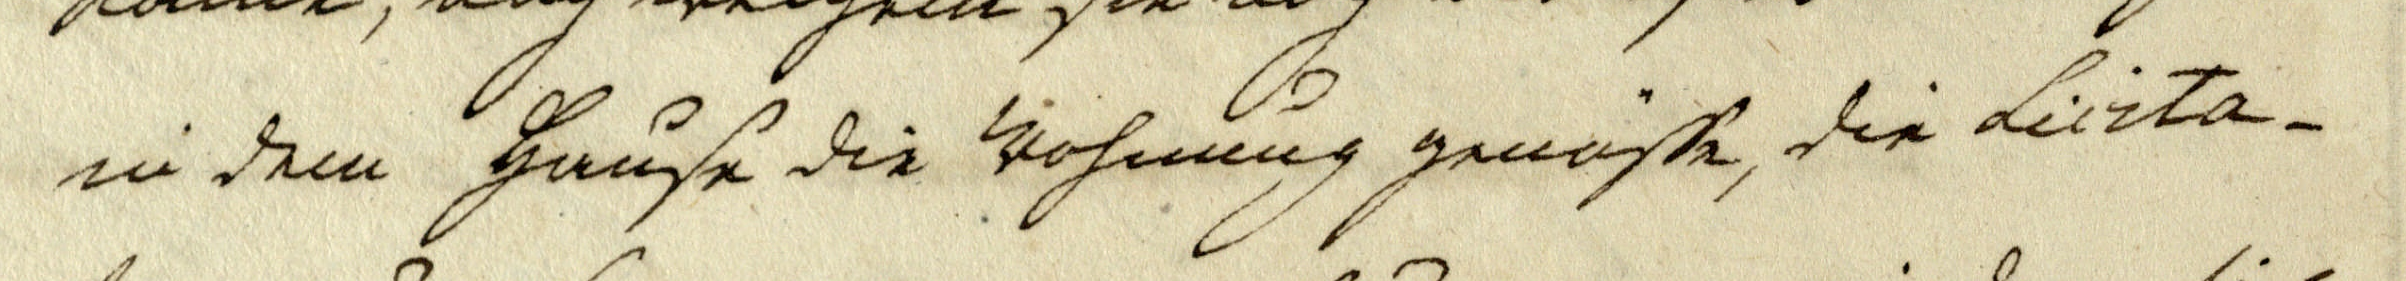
in dem Hause die Wohnung genösse, die Licita¬
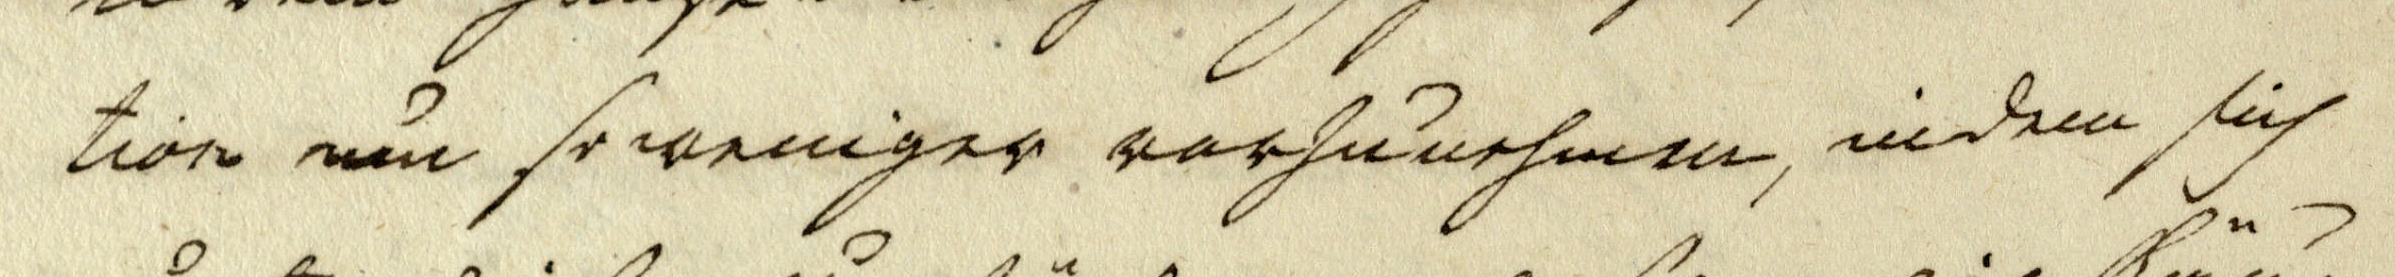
tion um so weniger vorzunehmen, in dem sich
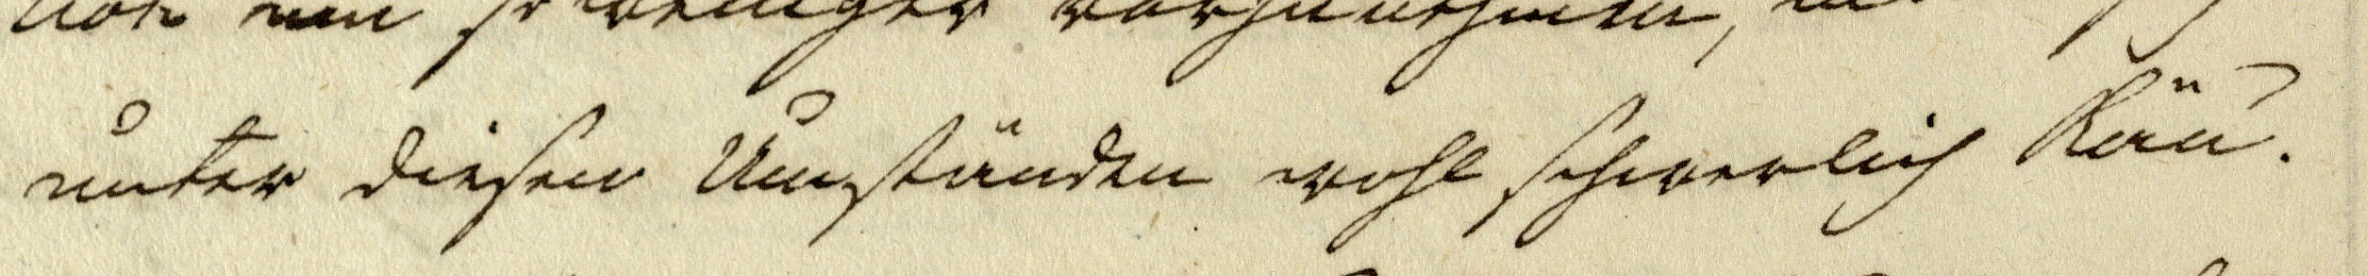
unter diesen Umständen wohl schwerlich Käu¬
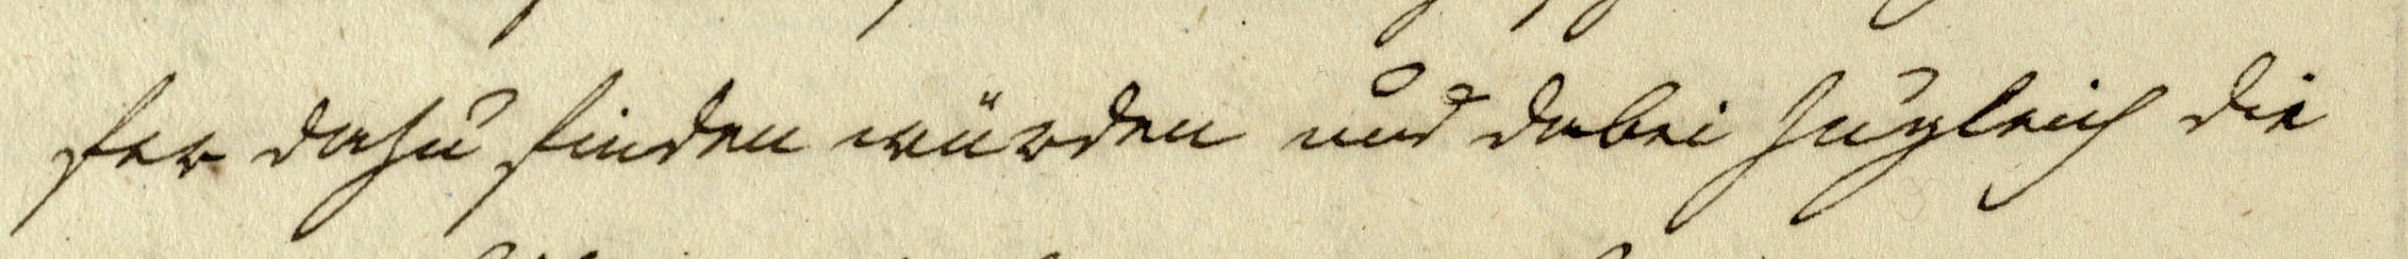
fer dazu finden würden und dabei zugleich die
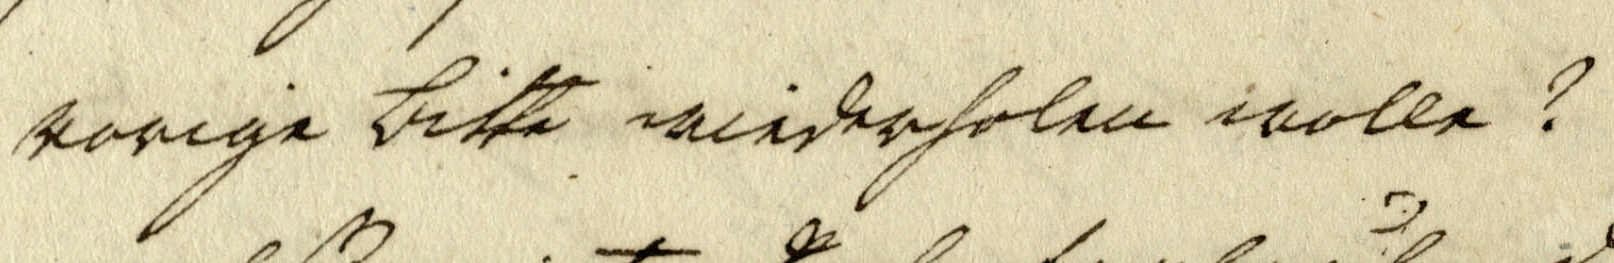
vorige Bitte wiederholen wolle?
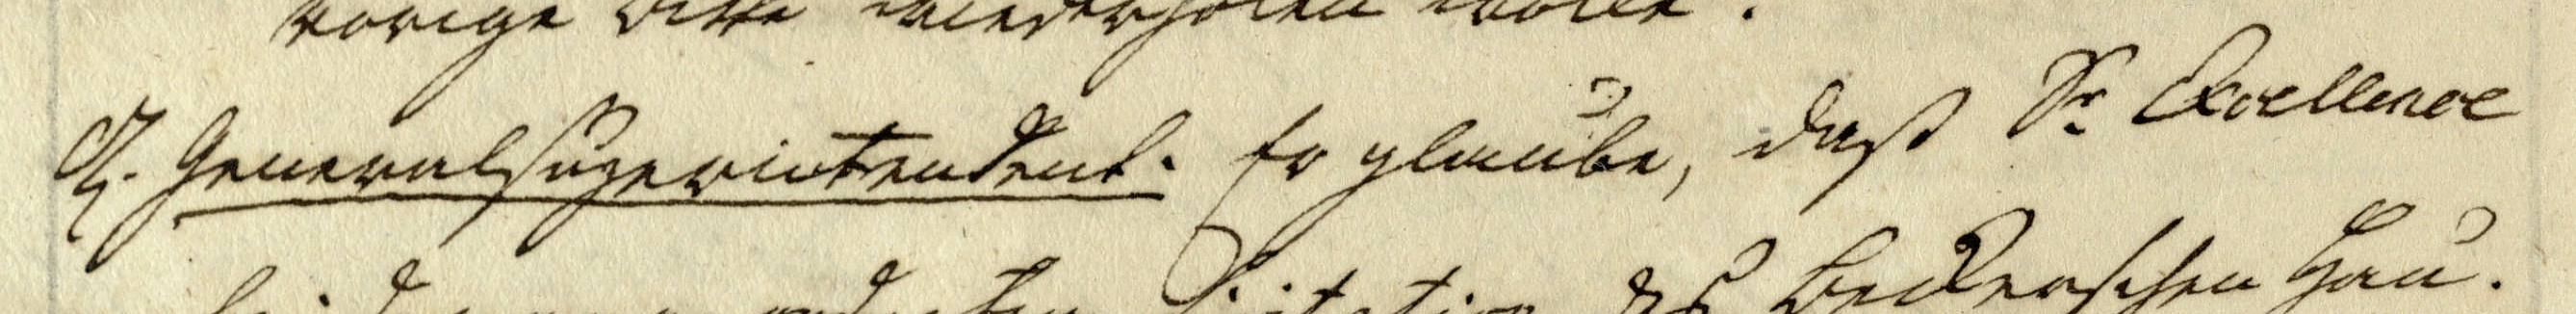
dh. Generalsuperintendent. Er glaube, daß Sr Excellence
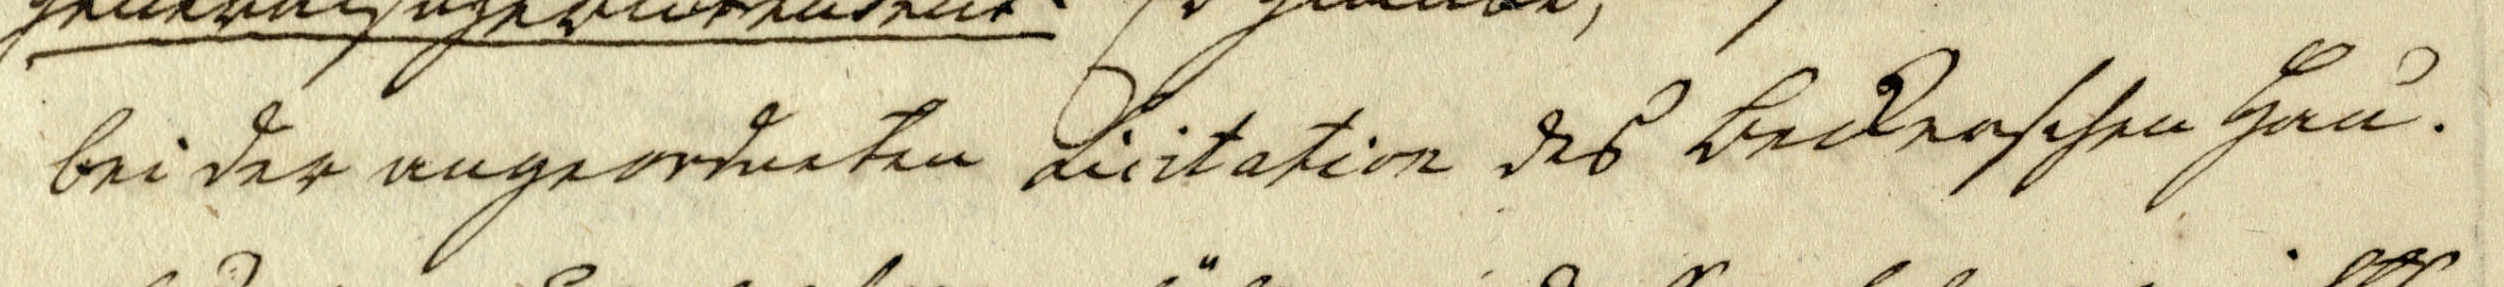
bei der angeordneten Licitation des Beckerschen Hau¬
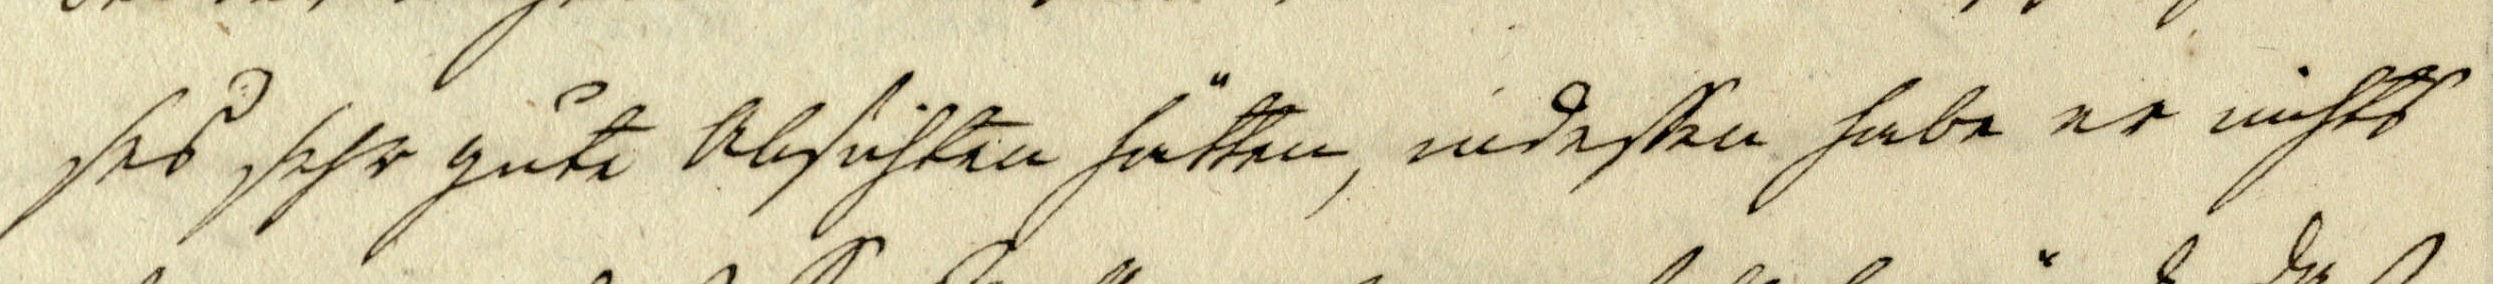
ses sehr gute Absichten hätten, indessen habe er nichts
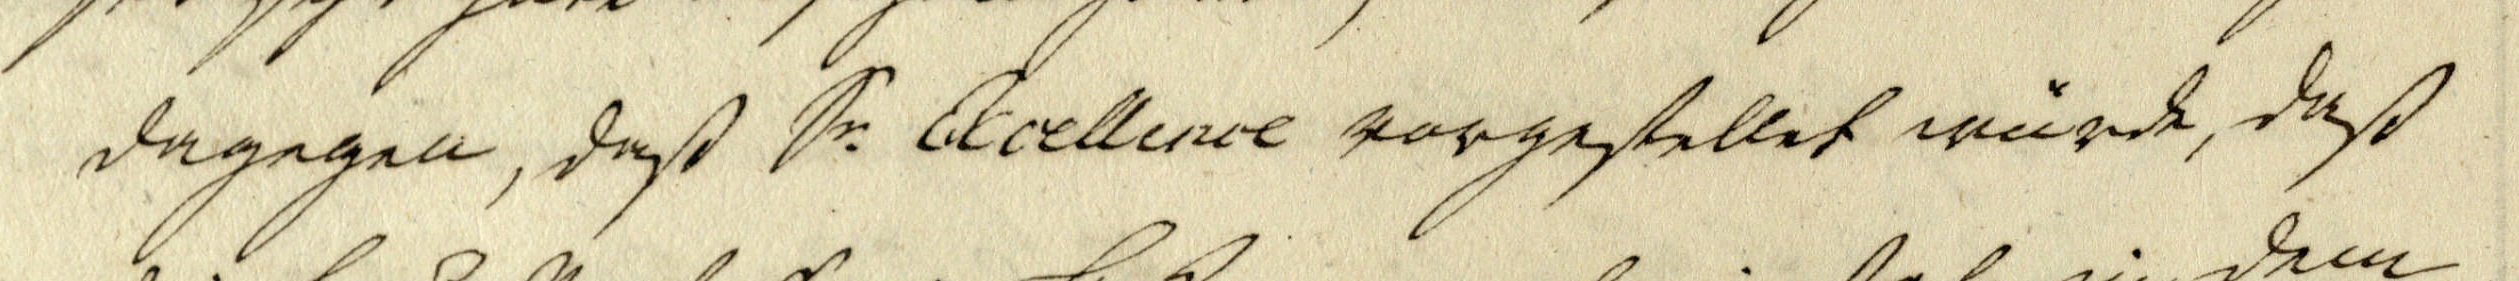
dagegen, daß Sr Excellence vorgestellet würde, daß
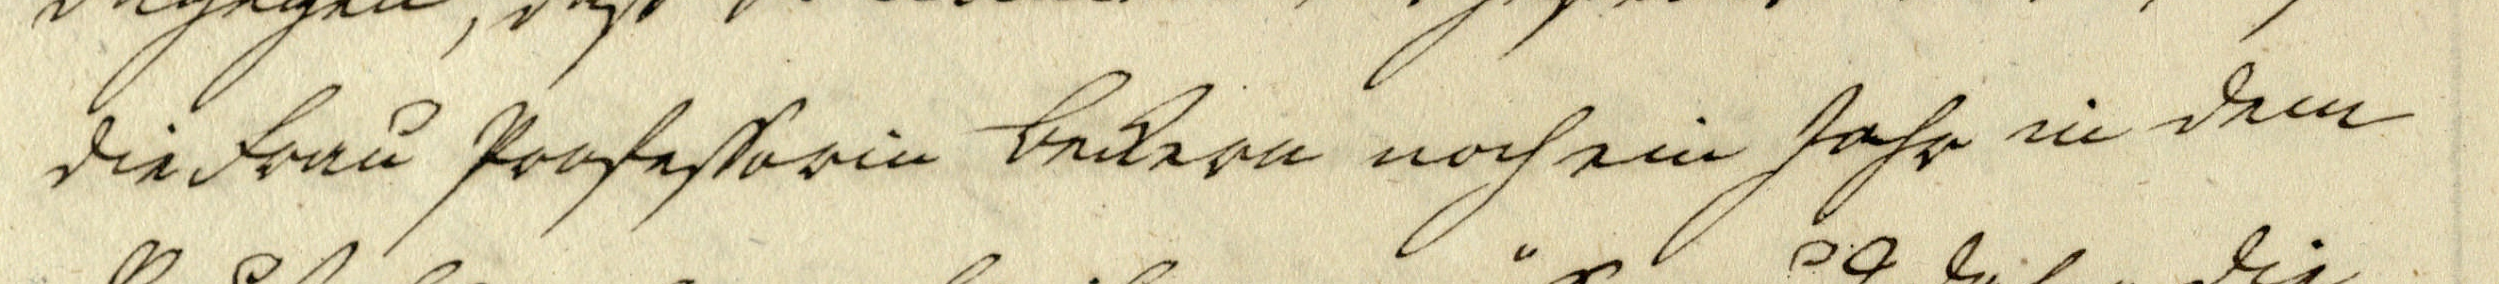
die Frau Professorin Beckern noch ein Jahr in dem
